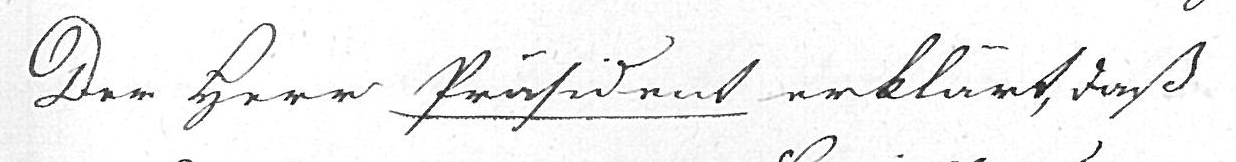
Der Herr Präsident erklärt, daß
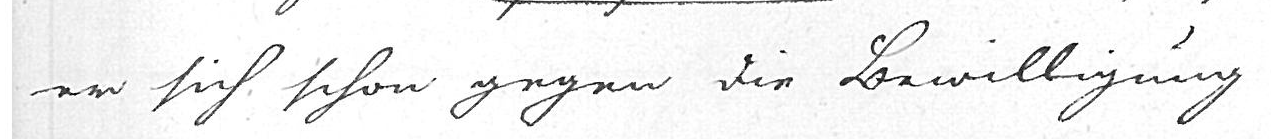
er sich schon gegen die Bewilligung
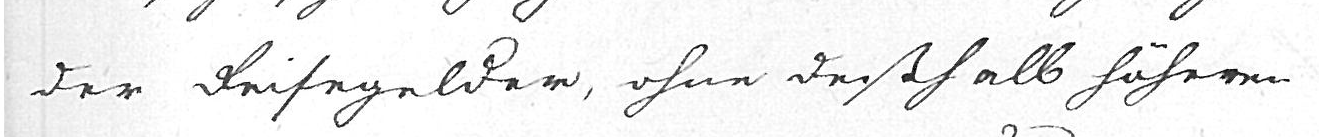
der Reisegelder, ohne deßhalb höheren
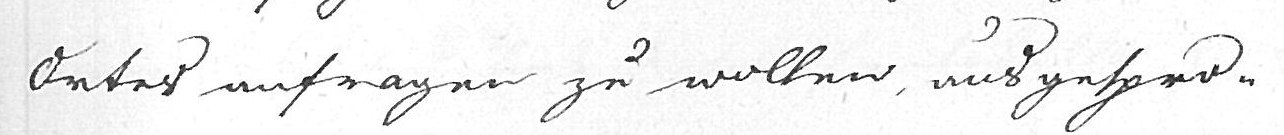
Ortes anfragen zu wollen, augespro-
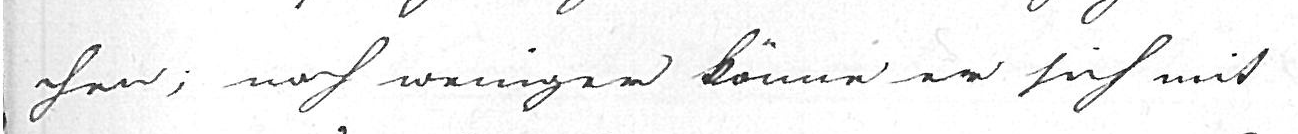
chen; noch weniger könne er sich mit
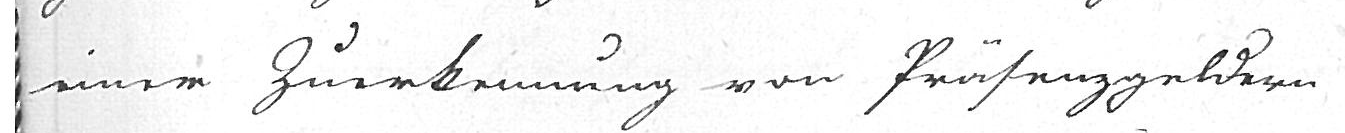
einer zuerkenneung von Präsenzgeldern
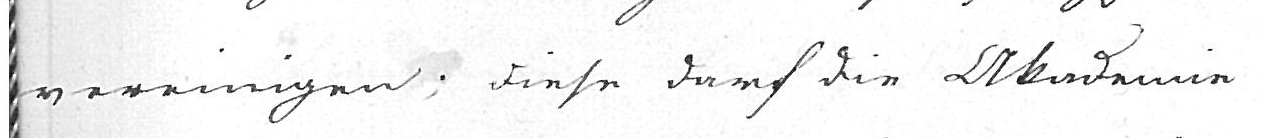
vereinigen; diese darf die Akademie
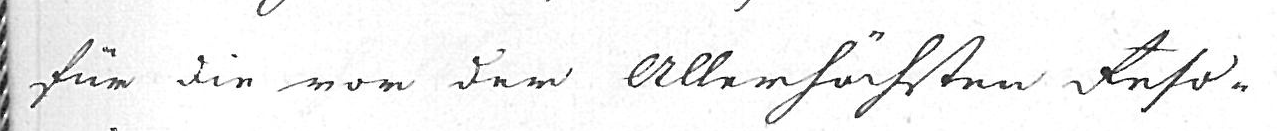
für die vor der Allerhöchsten Reso-
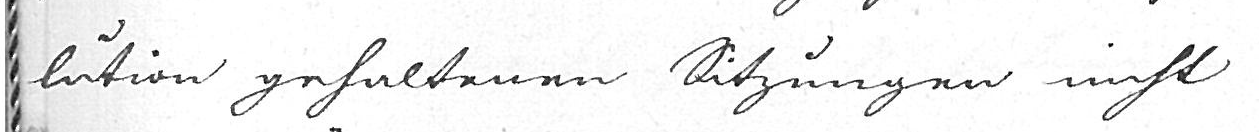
lution gehaltenen Sitzungen nicht
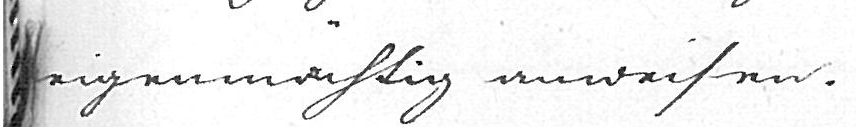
eigenmächtig anweisen.
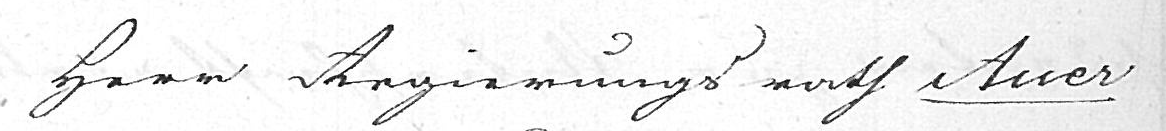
Herr Regierungsrath Auer
